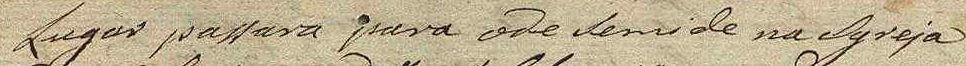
Lugar passara para o de semide na Igreja
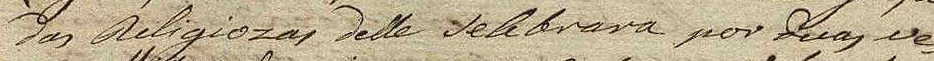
das Religiozas delle selebrava por duas ve
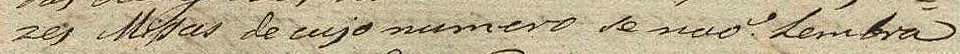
zes Missas de cujo numero se naõ lembra
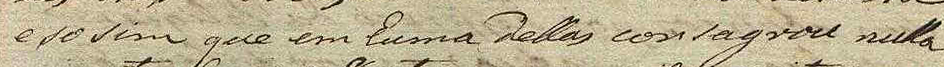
e so sim que em huma dellas consagrou nulla
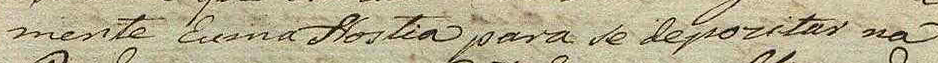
mente huma Nostia para se depozitar na
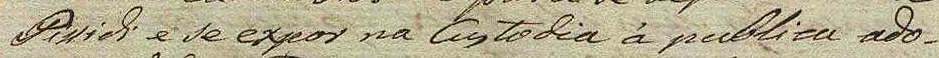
Pissidi e se expor na Custodia à publica ado
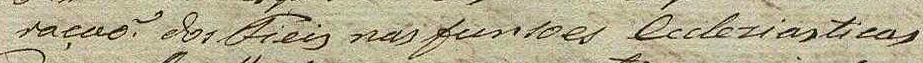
raçaõ dos Fieis nas funsoes eccleziasticas
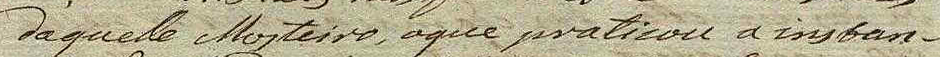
daquelle Mosteiro, o que praticou a instan
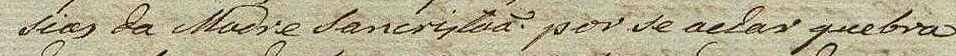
sias da Madre sancristaã por se achar quebra
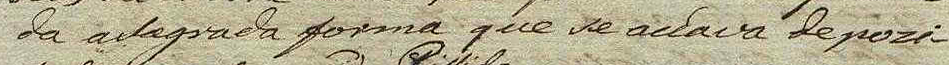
da a sagrada forma que se achava depozi
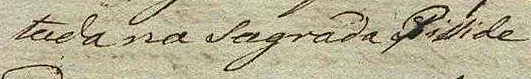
tada na sagrada Pisside
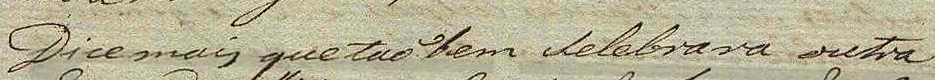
Dice mais que taõbem selebrara outra
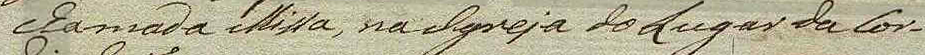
chamada Missa, na Igreja do Lugar da Cor
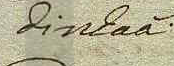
dinhaã
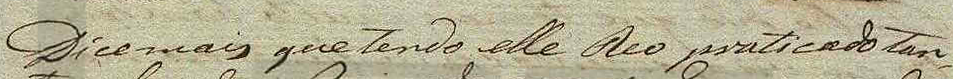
Dice mais que tendo elle Reo praticado tan
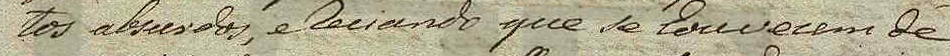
tos absurdos, e Reciando que se houvecem de
